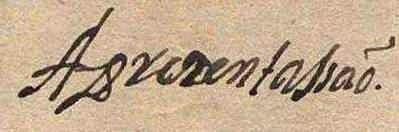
Aprezentassaõ.
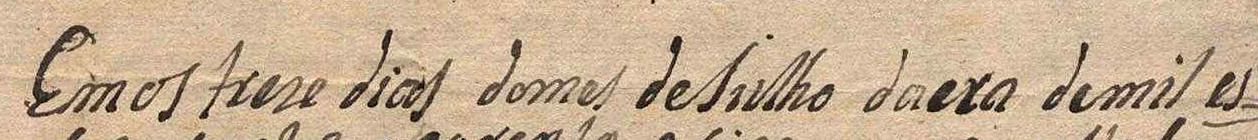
Em os treze dias do mes de Iulho da era de mil e s
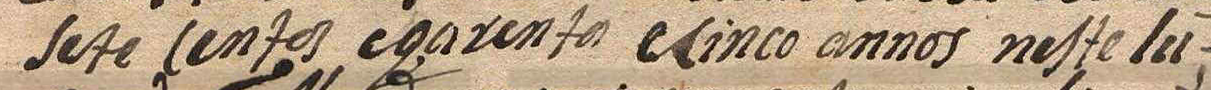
setecentos e qarenta e sinco annos neste lu
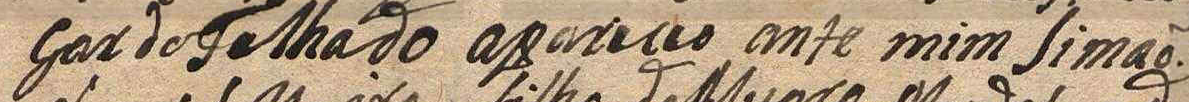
gar do Telhado apareceo ante mim simaõ.
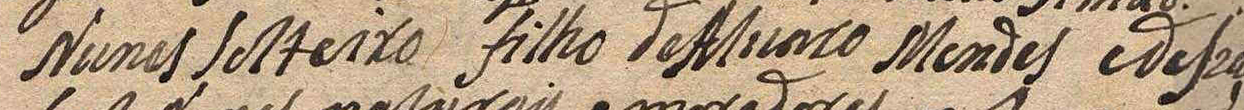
Nunes solteiro filho de Aluaro Mendes e de Jza
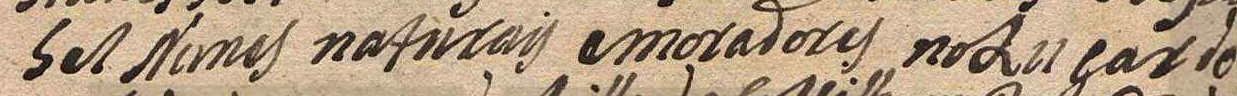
bel Nunes naturais e moradores no lugar do
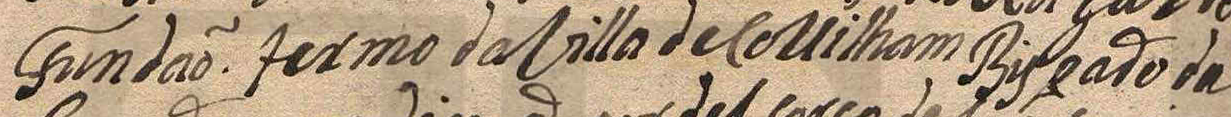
Fundaõ. termo da Villa de Couilham Bispado da
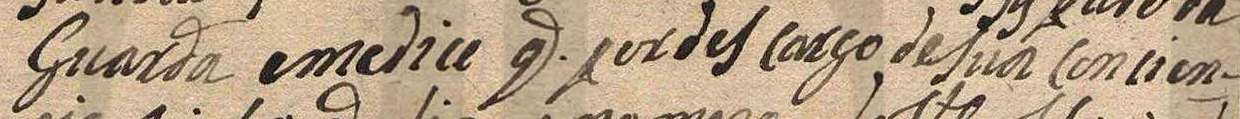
Guarda e me dice q̄ por descargo de sua concien
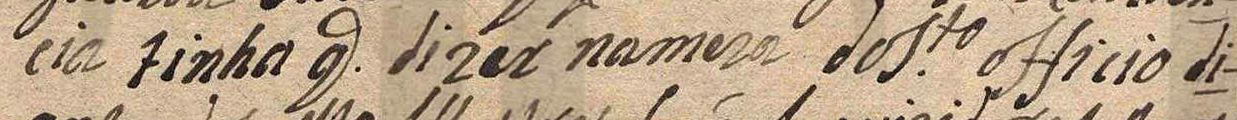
cia tinha q̄. dizer na meza do S.to officio di
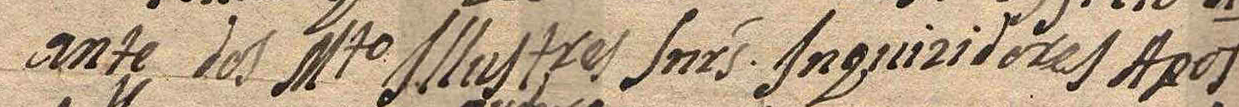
ante dos Mto Illustres Snrs̄. Jnquizidores Apos
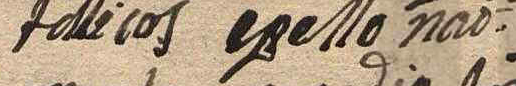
tollicos e pello naõ
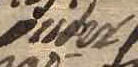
puder
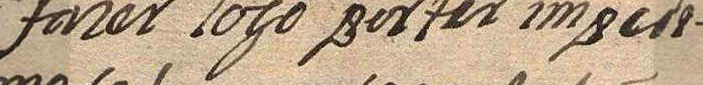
fazer logo por ter impedi
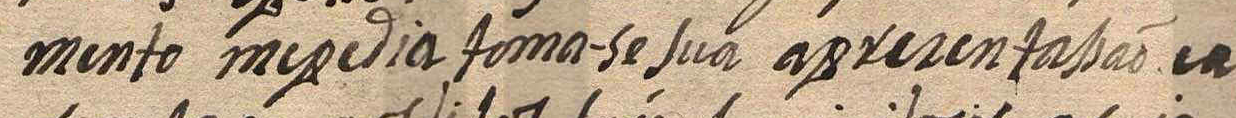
mento me pedia toma-se sua aprezentassaõ e a
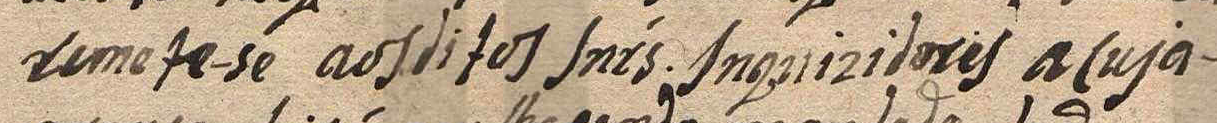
remete-se aos ditos snrs̄. Inquizidores a cuja
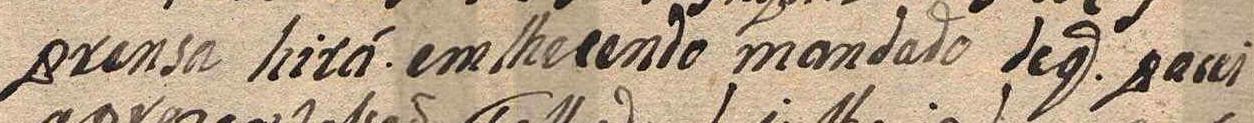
prensa hirá. em lhe cendo mandado de q̄. pacei
